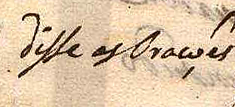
disse as Oraçoẽs
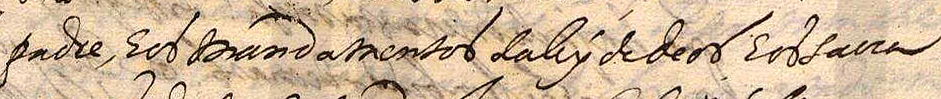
padre, E os Mandamentos da ley de deos, E os sacra
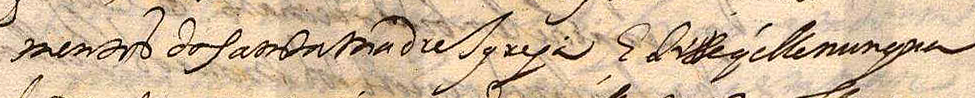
mentos da sancta madre Igreja, E disse q̄ elle nunqua
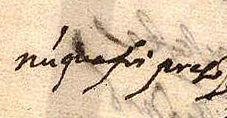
nūqua foi preso
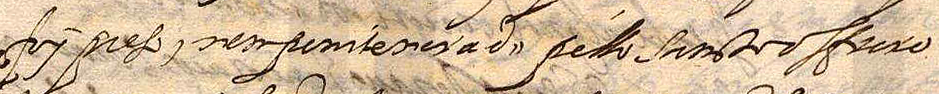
foy preso, nem penitenciado pello sancto officio
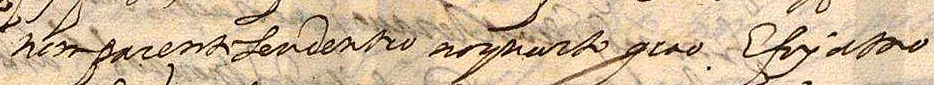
nem parente seu dentro no quarto grao. E foy amo
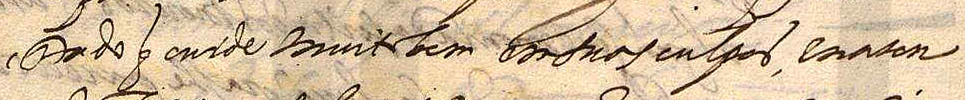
estado q̄ cuide muito bem em suas culpas, e na ten
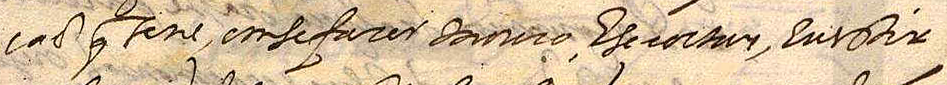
çaõ q̄ teue, em se fazer mouro, E se cortar, E uestir
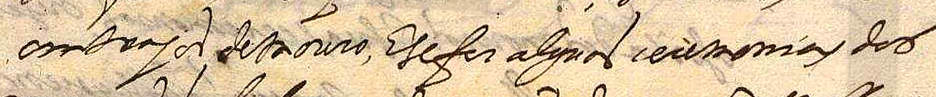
em trajos de mouro, E se fez alguas̄ ceremonias dos
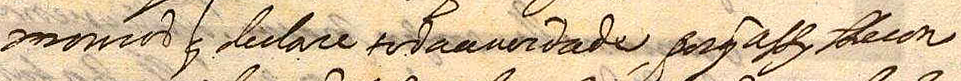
mouros q̄ declare toda a uerdade, porq̄ assy lhe con
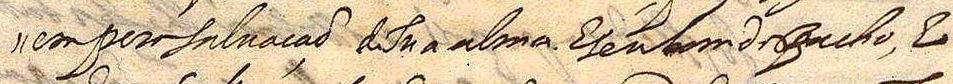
uem pera saluaçaõ de sua alma E seu bom despacho, E
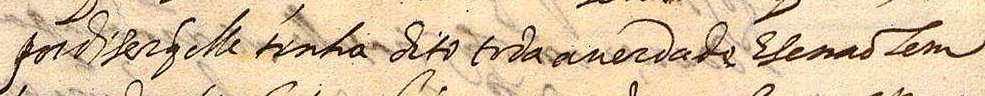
por diser q̄ elle tinha dito toda a uerdade E se naõ lem
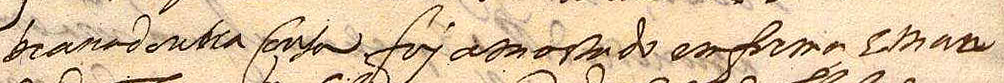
braua doutra Cousa foj amostado em forma E man
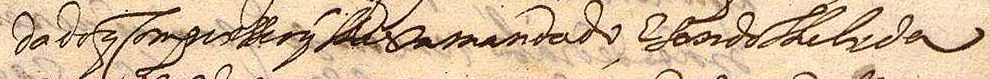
dado q̄ Comprisse o q̄ lhe esta mandado, E sendolhe lida
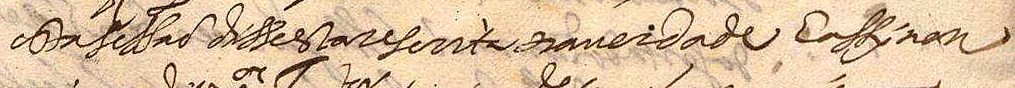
esta sessaõ disse estar escrita na uerdade E assynou
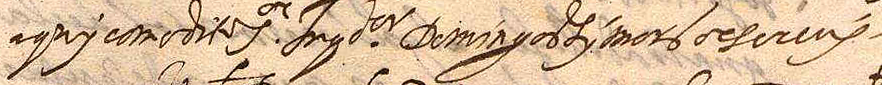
aquy com o dito Sor. Inqd.or Domingos Symois o escreuj
